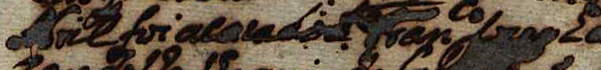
Abril foi a caza do d.o Franco Iozeph
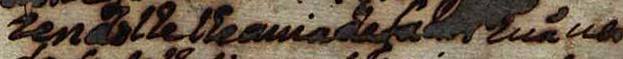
zendolhe lhe auia de fa_ huā uer
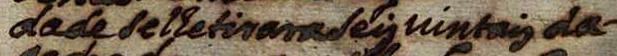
dade se lhe tirara seis uintais da
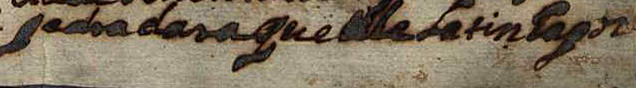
pedra dara que elle La tinha poz
